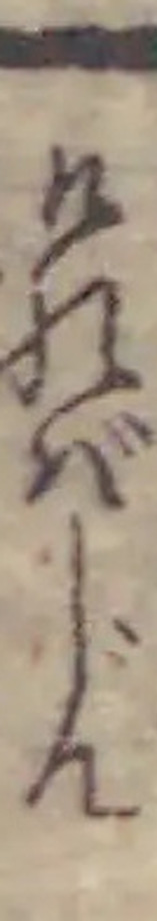ければしん
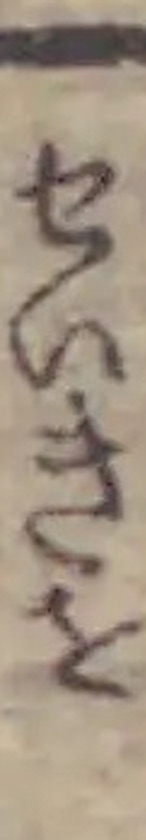せいきを
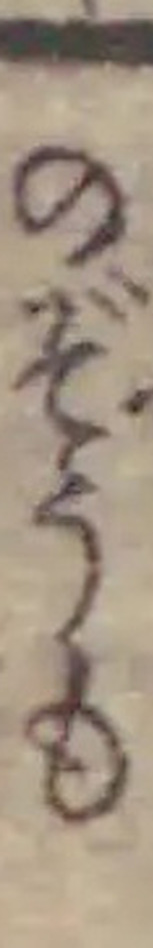のぞうも
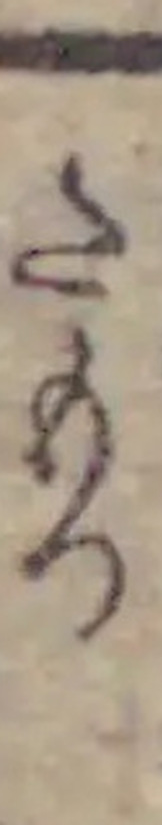たもつ
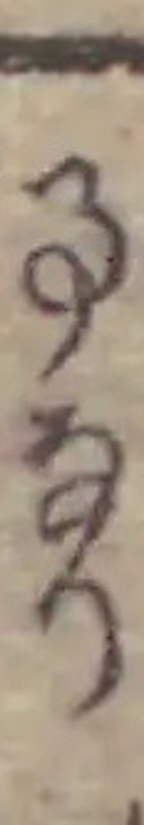事なり
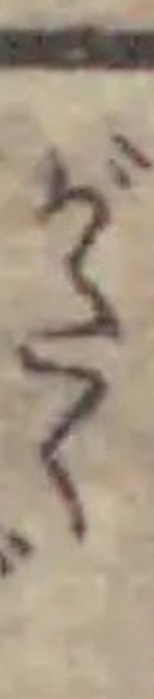がたく
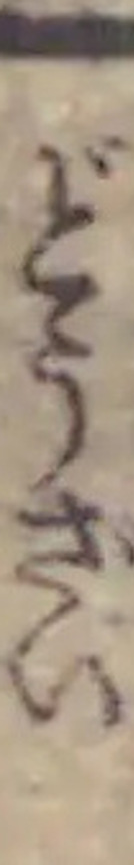どうざい
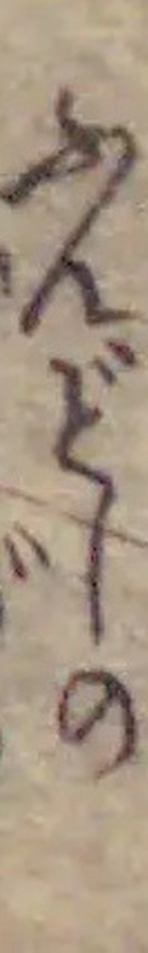ふんどしの
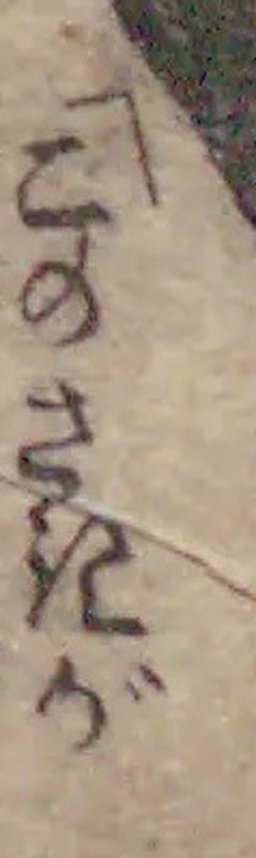〽このさきが
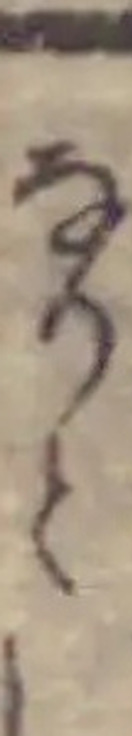なりと
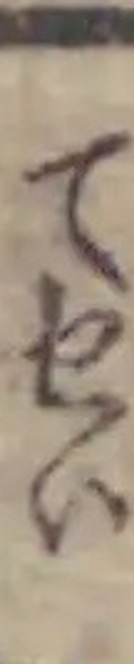てせい
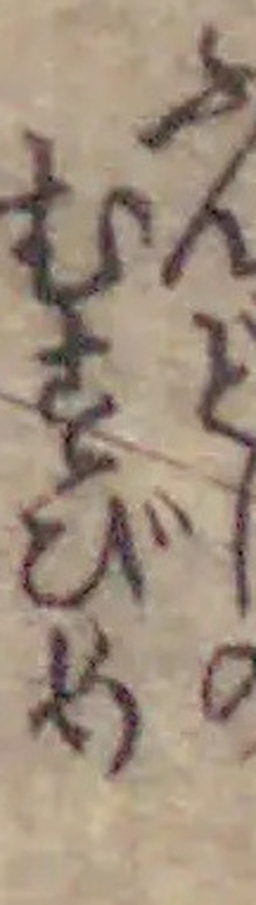むすびめ
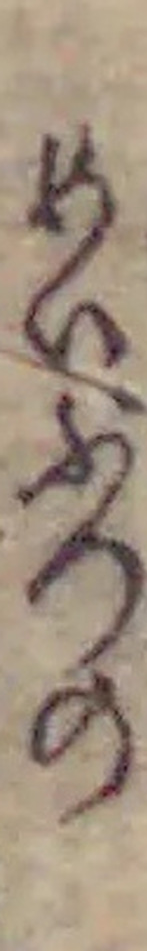めいふつの
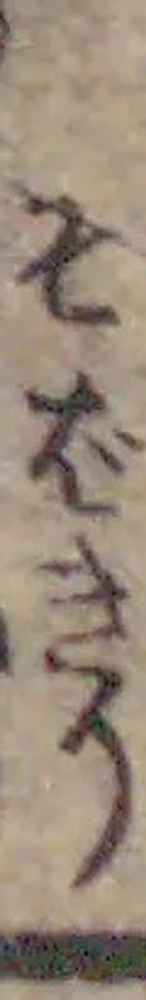そばきり
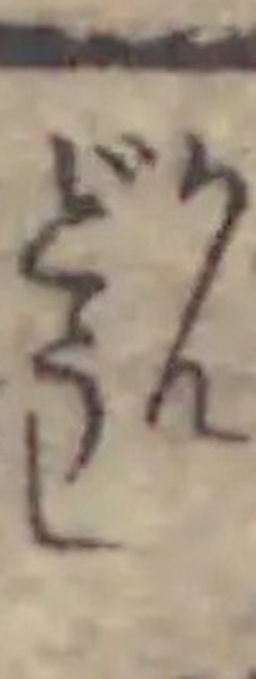どうし
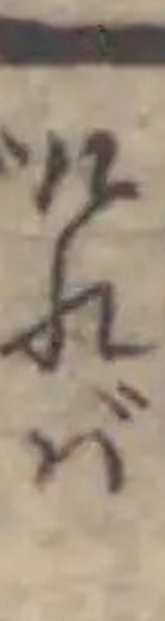ければ
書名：腹内養生主論 3巻
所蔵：国立国会図書館 National Diet Library, JAPAN
